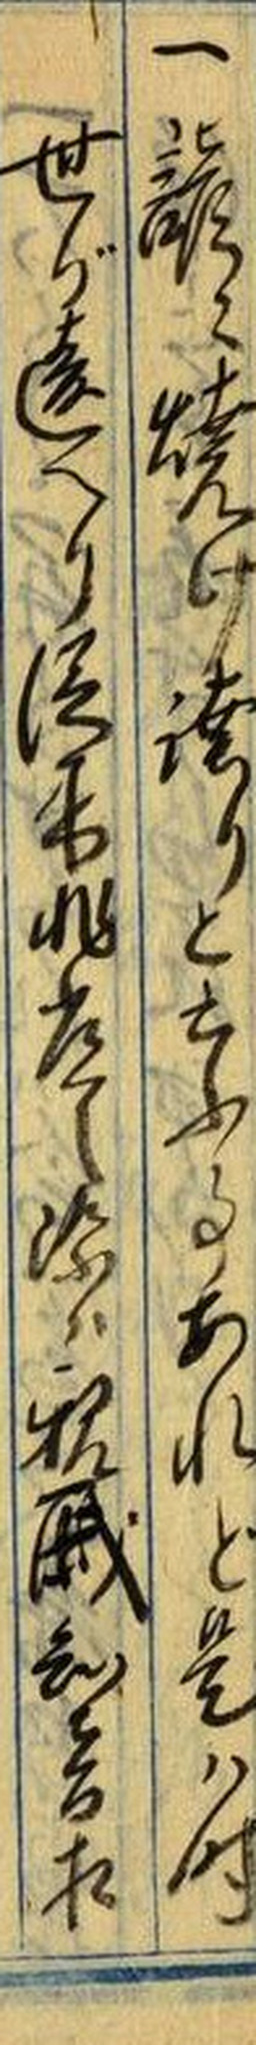世が違へり従来非常之際ハ親戚知音相
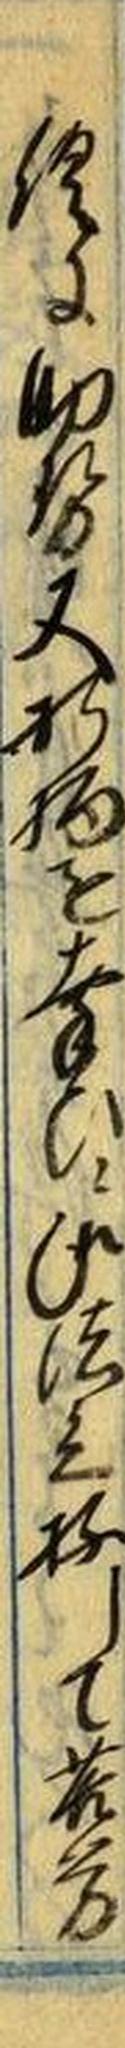俱に助勢又折柄を幸ひニ趣法立抔して苦労
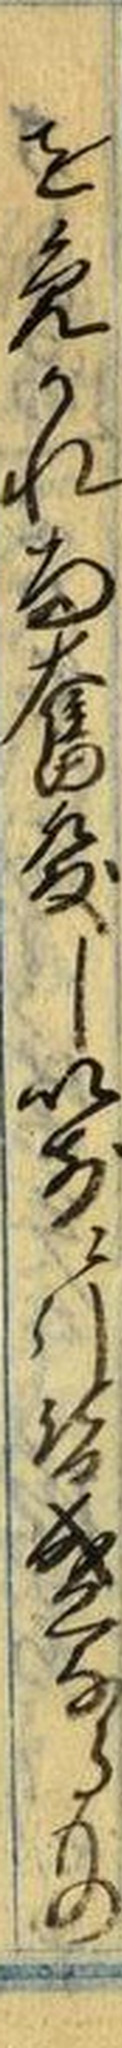を免かれ尚奮発し以前ニ引替盛なるもの
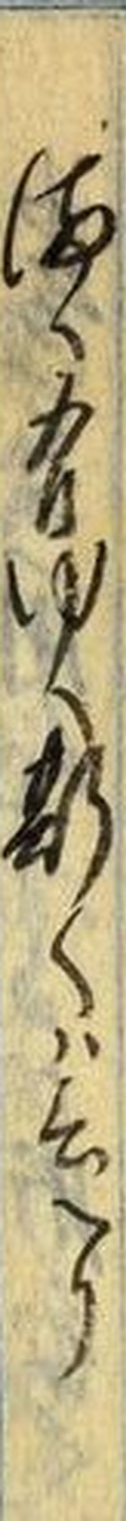備へ有ゆへ斯くハ云へり
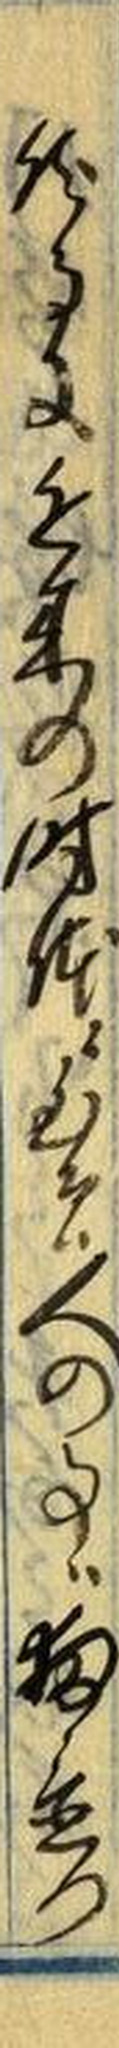然るに近来の時体ニ至而ハ人の事ハ扨置り
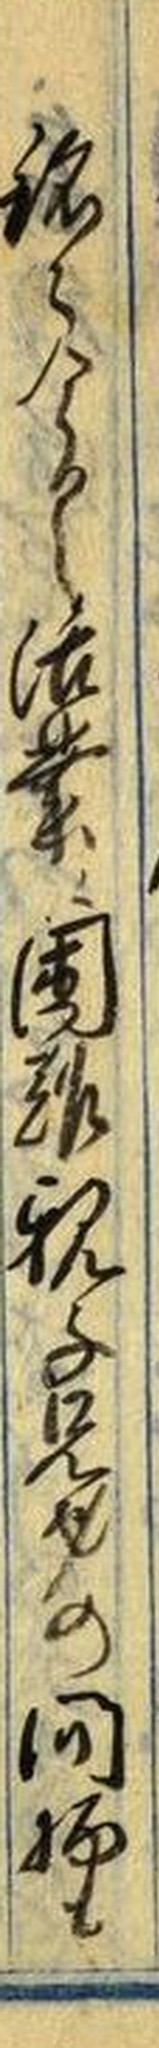銘々今日之活業二困難親子兄弟の間柄も
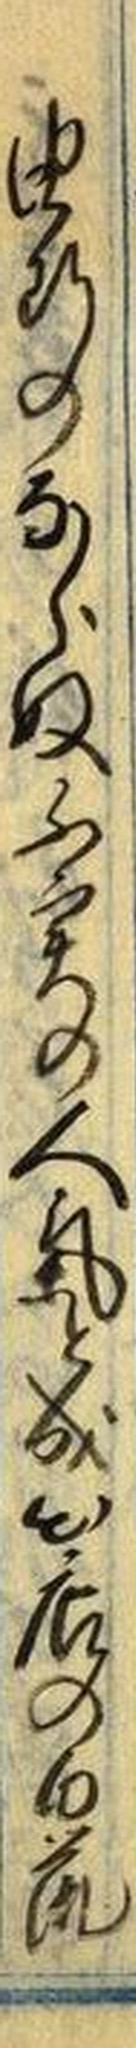油断のならぬ不実の人気と成出店の白鼠
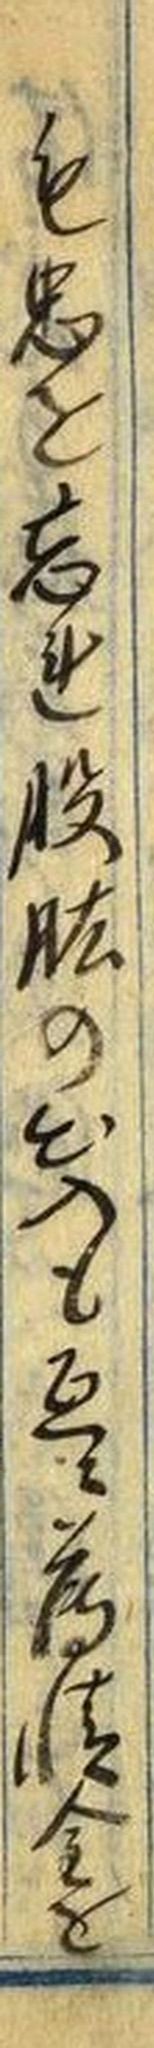も忠を忘れ股肱の出入も互ニ薄情金を

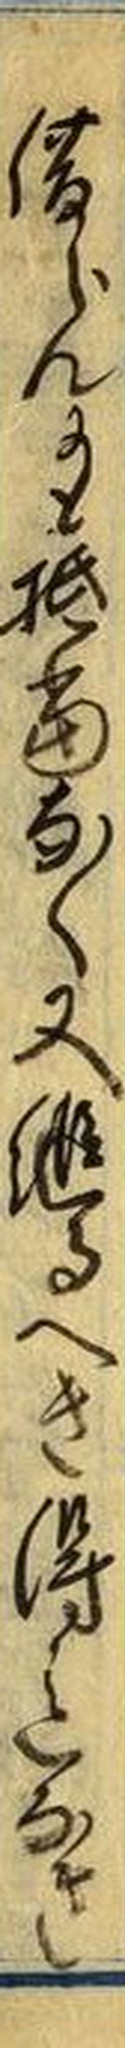借らんにも抵当なく又縋るへき得意なき
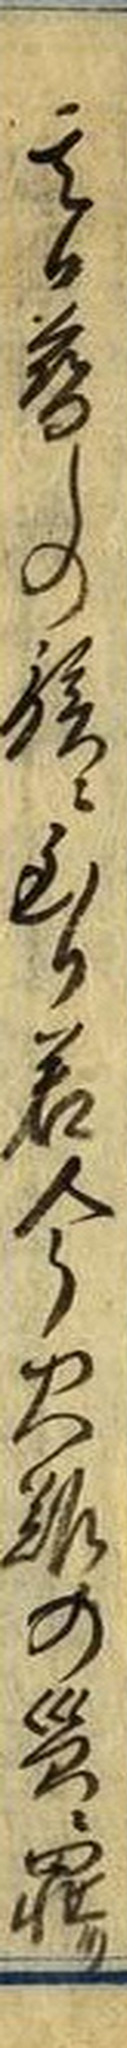其日暮しの族ニ至り若今火難の災ニ罹り
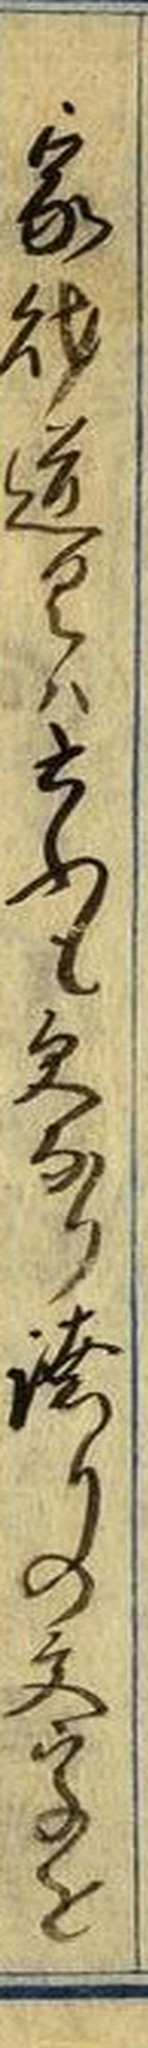家財道具ハ亡ふも更なり誇りの文字を
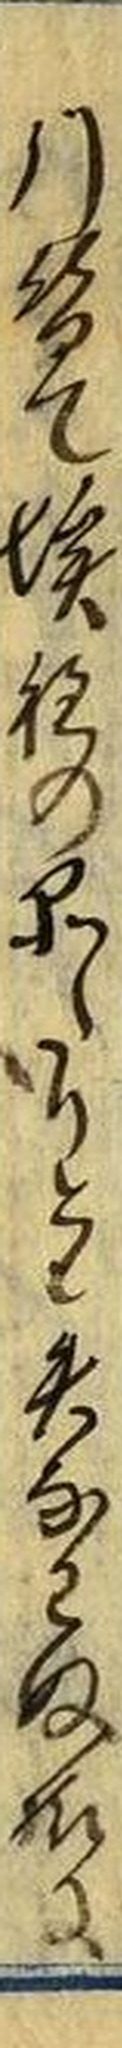引替て埃程の品々たりとも失なわぬ様に
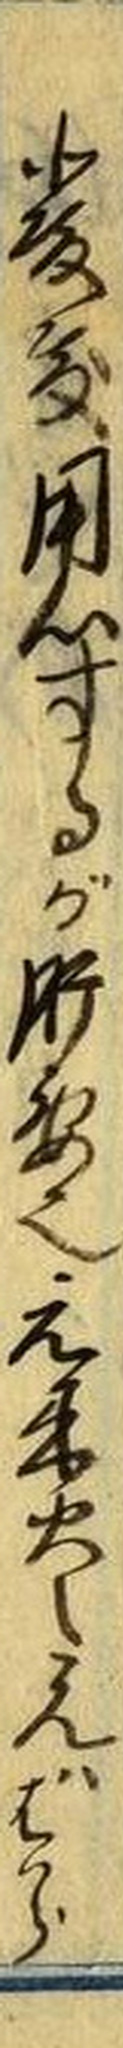厳敷用心するが肝要也元来火之元ハはから
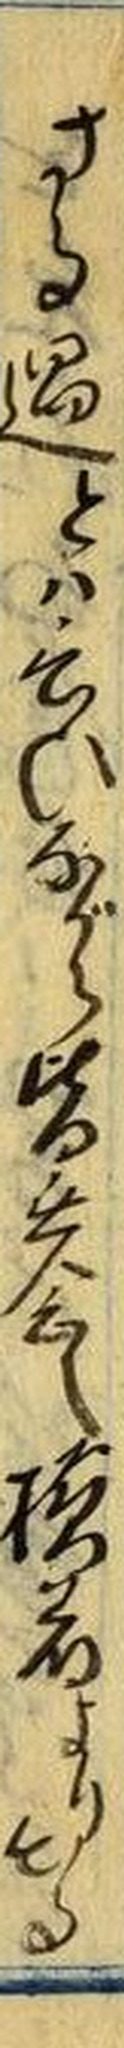さる過とハ云ひながら皆失念之横着より出る
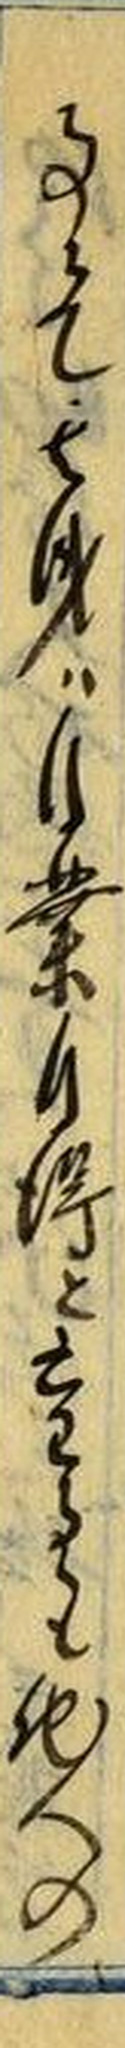事ニて其身ハ自業自得と云わるゝも他人の
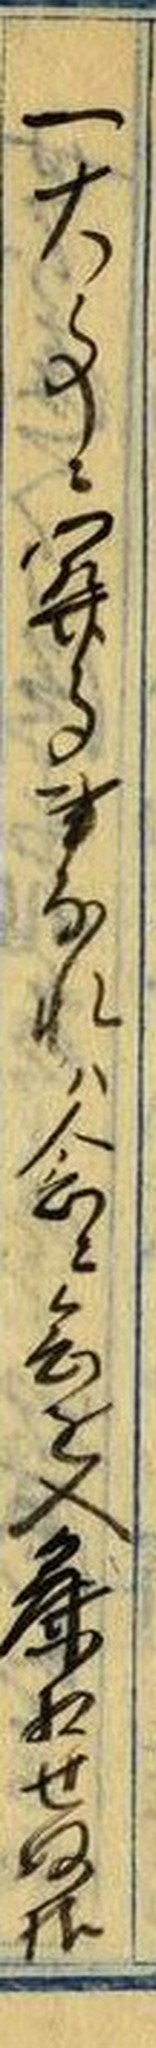一大事ニ関る事なれハ念ニ念を入麁相せぬ様
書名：温古集 五巻
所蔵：福井県文書館 Fukui Prefectural Archives
